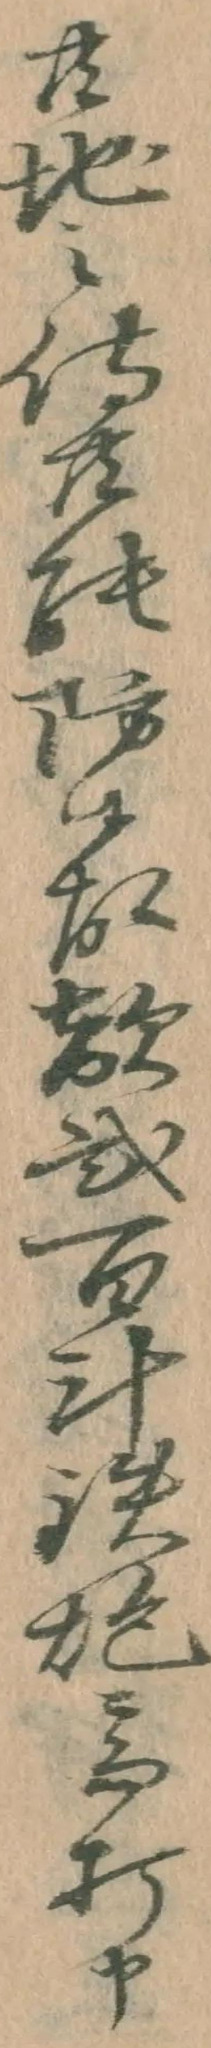共地之侍共能防候故敵弐百斗鉄炮に而打申
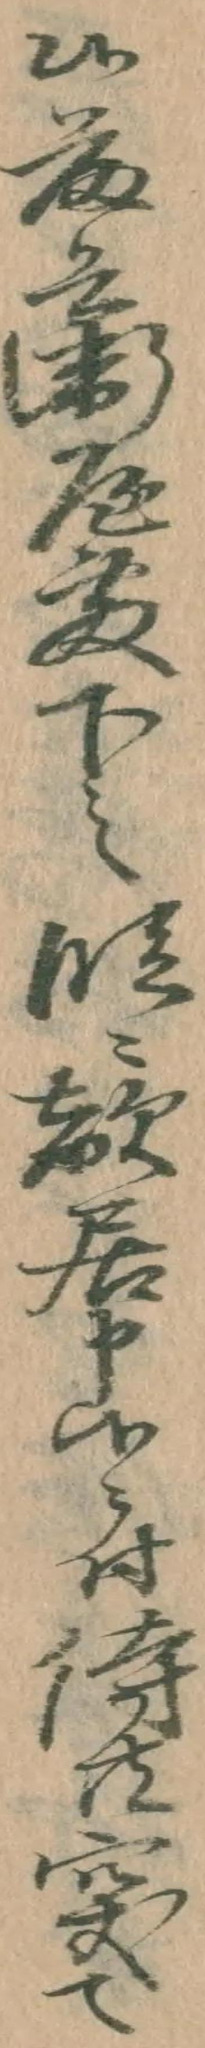候藤兵衛屋敷下之段に敵居申候に付侍共突て
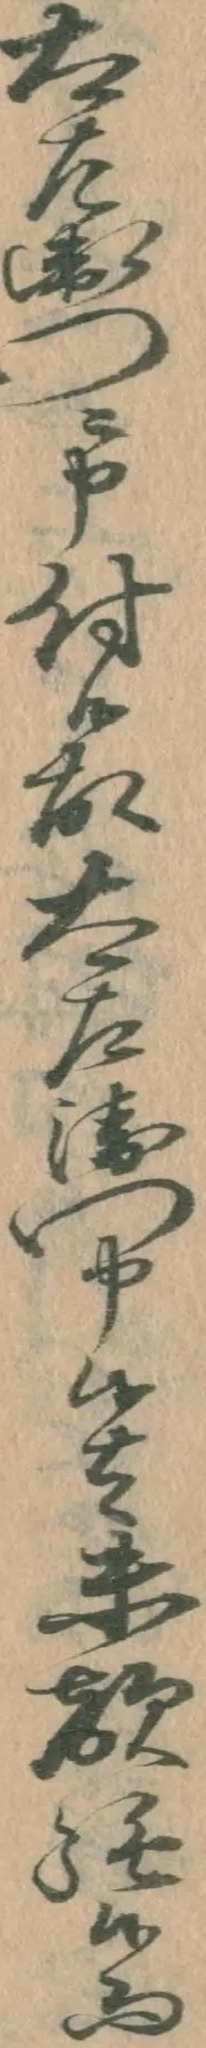太左衛門に申付候故太左衛門申候は未敵強候而
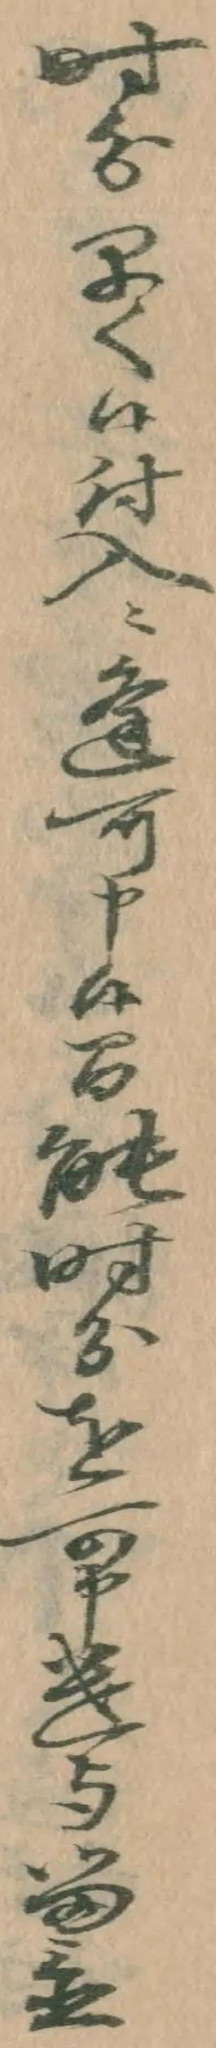時分早く候付入に逢可申候間能時分を可申遣と留置
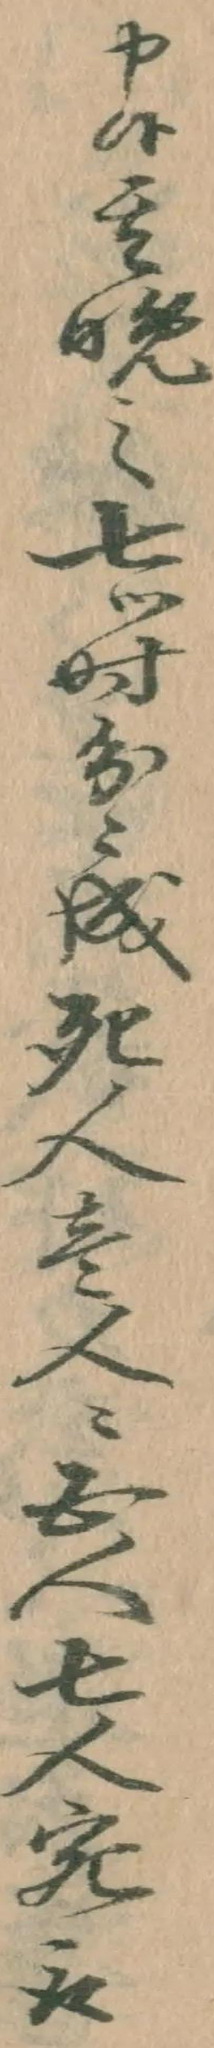申候其晩之七ッ時分に成死人壱人に五人七人宛取
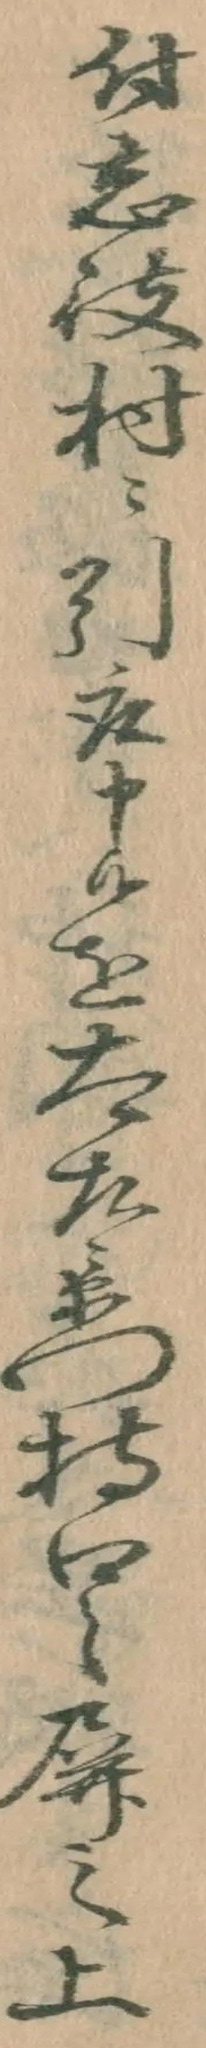付志岐村に引取申候を太左衛門持口之屏之上
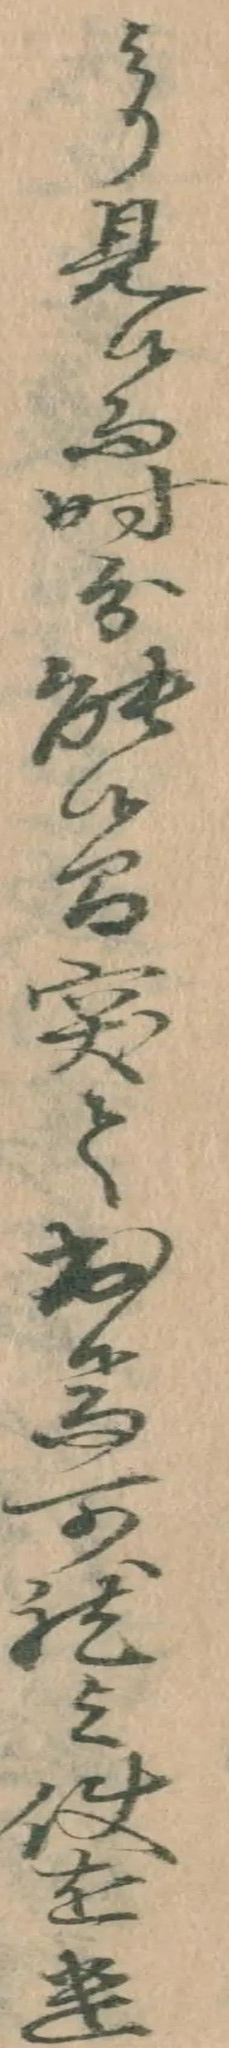より見候而時分能候間突て出候而可然と使を遣
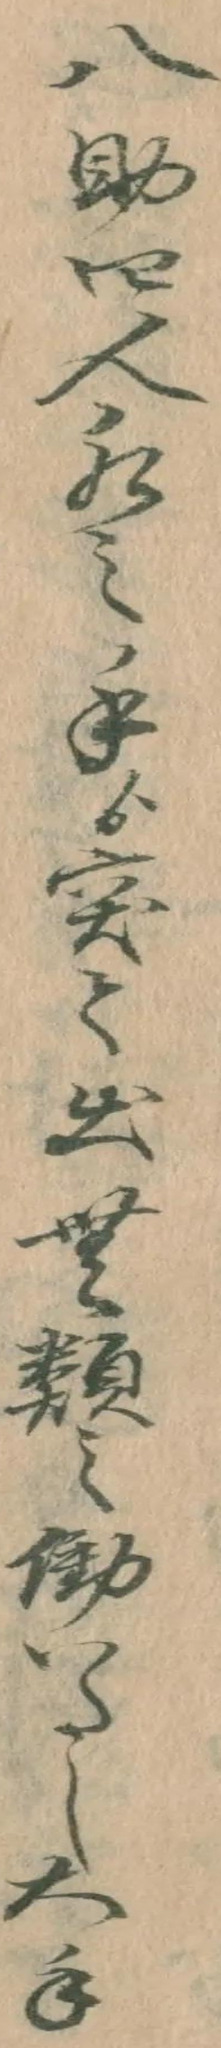八助四人水之手ゟ突て出無類之働いたし大手
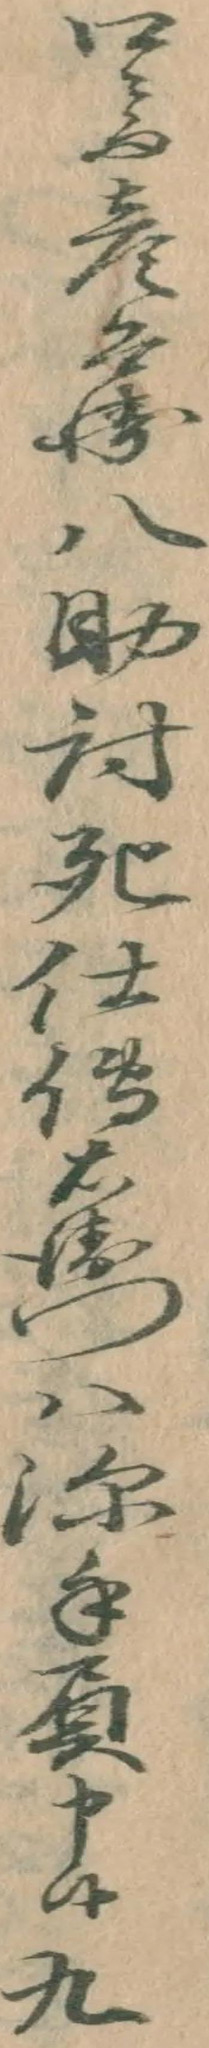口に而彦兵衛八助討死仕伝右衛門は深手負申候九
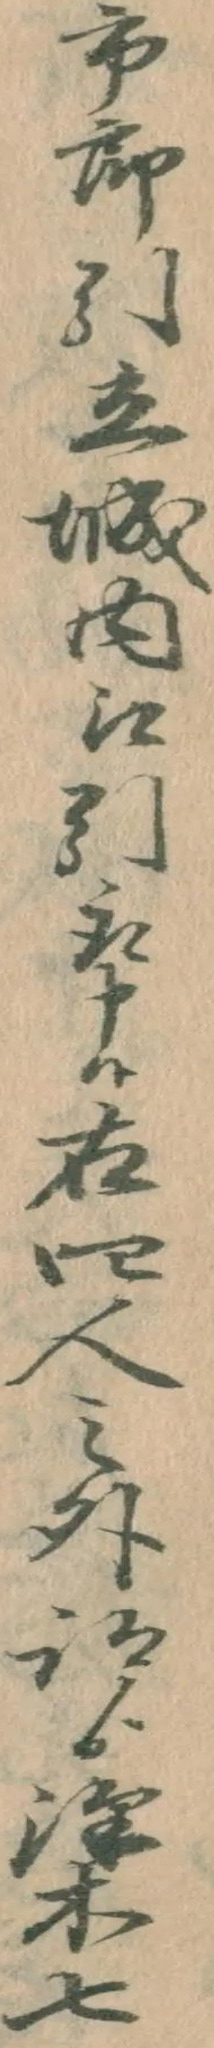市郎引立城内江引取申候右四人之外跡ゟ沢木七
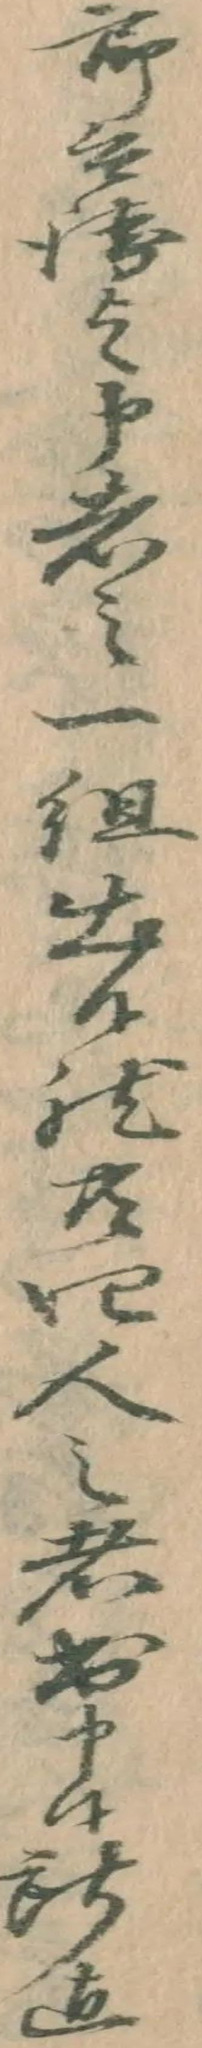郎兵衛と申者之一組出候然共四人之者出申候所迄

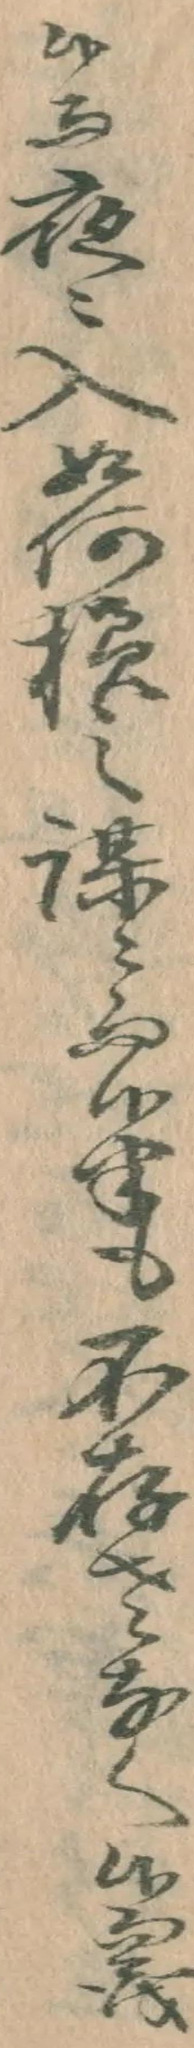候而夜に入如何様之謀に而候半も不存さなく候而も
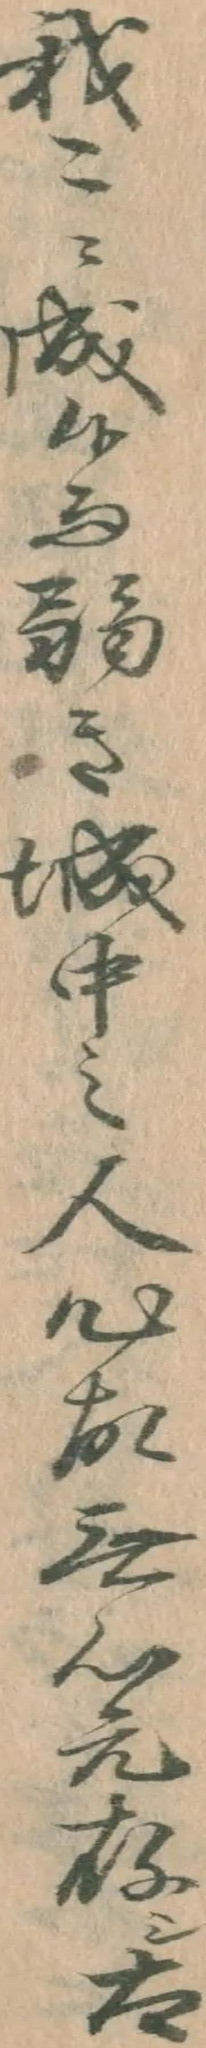我々に成候而弱き城中之人心故無心元存シ太
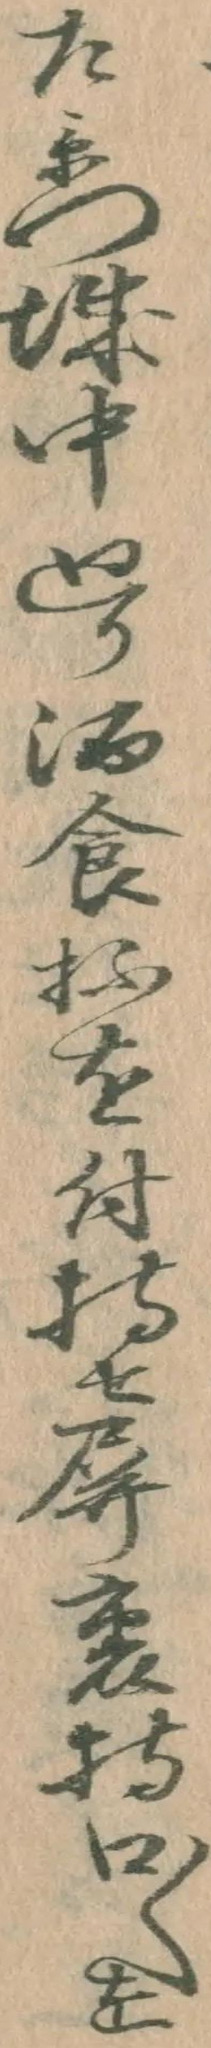左衛門城中廻り酒食抔を付持セ屏裏持口〳〵を
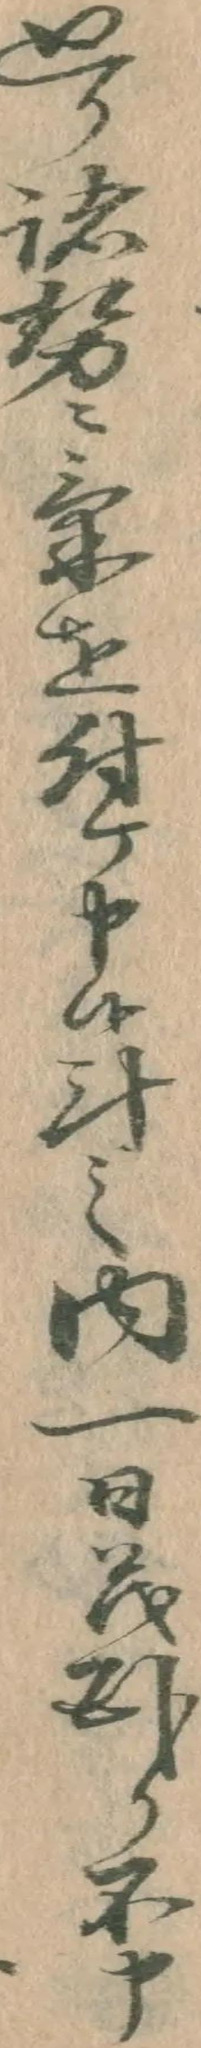廻り諸勢に気を付ケ申候斗之内一日も臥り不申
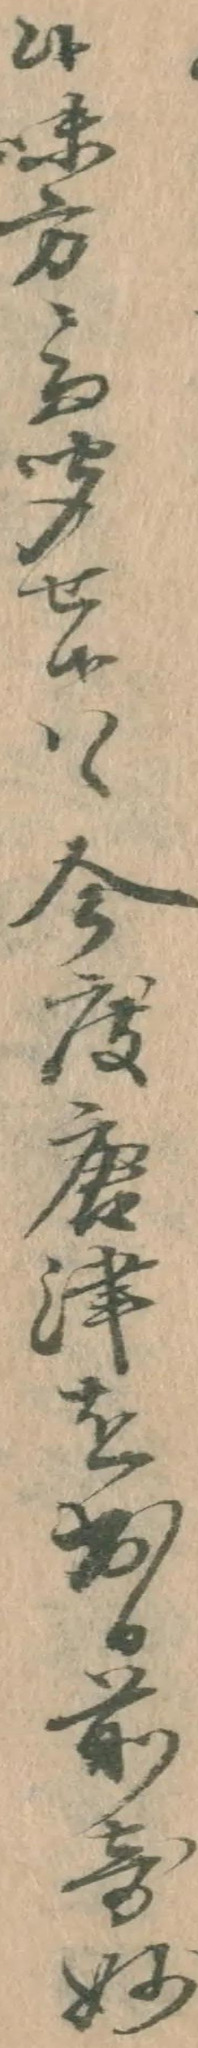候味方に而聞せ候はゝ今度唐津を出る前奇妙
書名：切支丹御退治記 49巻. [3]
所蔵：国立国会図書館 National Diet Library, JAPAN
